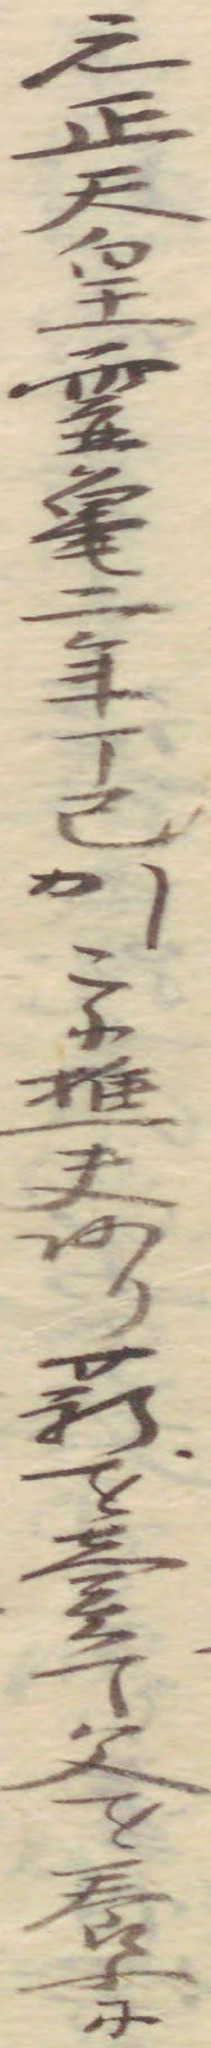元正天皇霊亀二年丁巳かしこに樵夫あり薪を売て父を養ふに
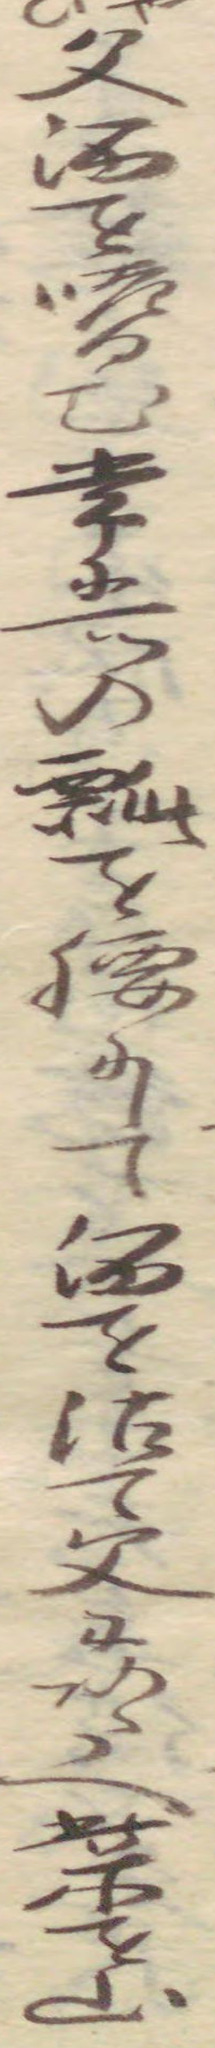父酒を嗜む常に一ツの瓢を腰にして酒を沽て父にあたへ柴を山
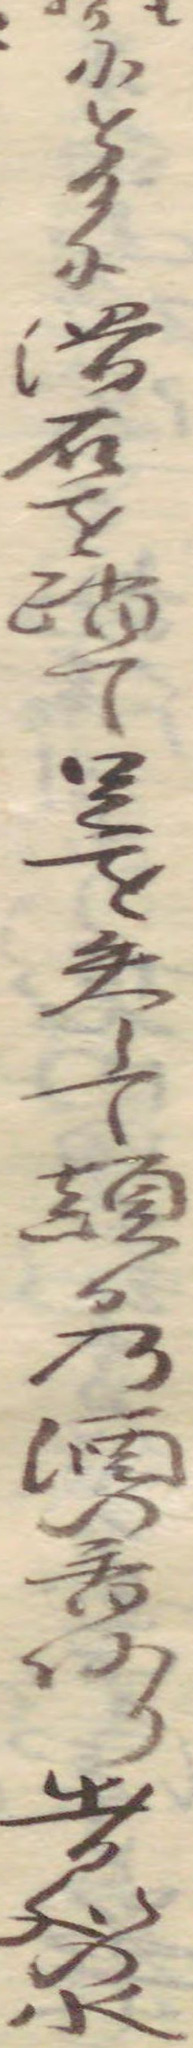にとるに滑石を踏て足を失して顛る乃酒の香あり出る処の水
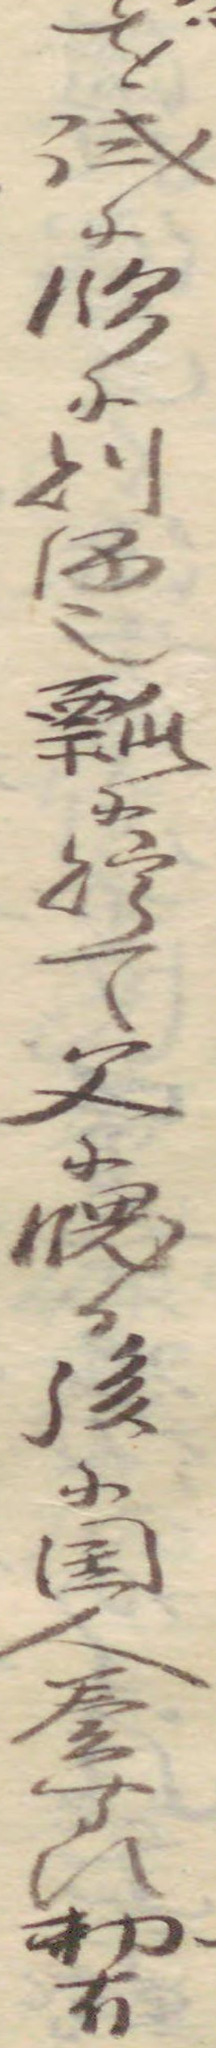を試に飲に則酒也瓢に貯て父に餽る後に国人奏聞す勅有
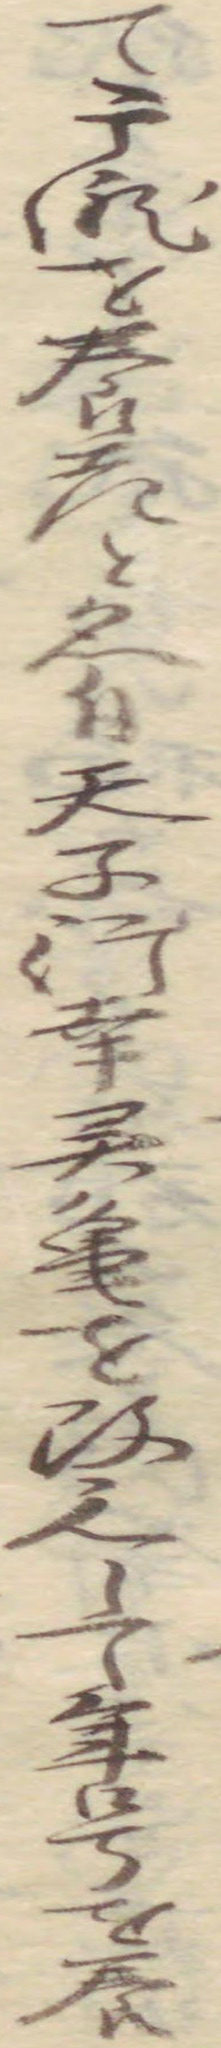て其滝を養老と名付天子行幸霊亀を改元して年号を養
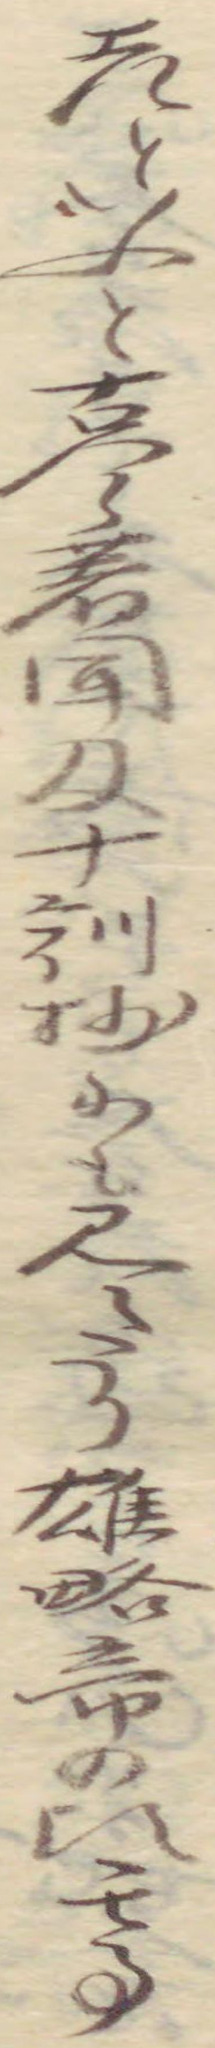老といふと古今著聞及十訓抄にも見えたり雄略帝の頃其事
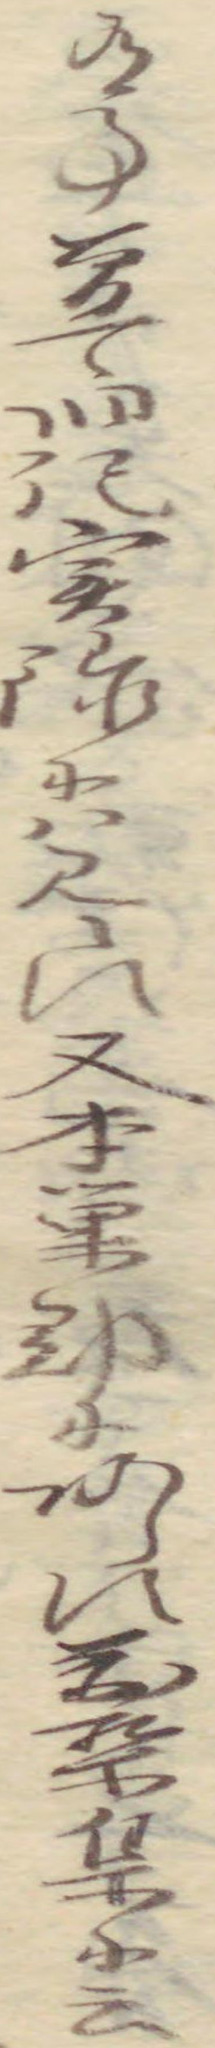有事曽て旧記実録には見えす又本巣郡にあらす万葉集に云
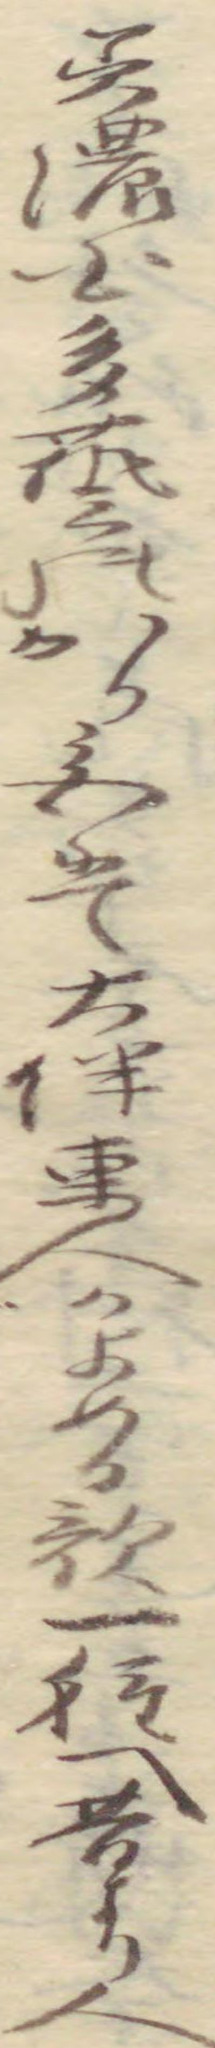美濃国多藝のかり宮にて大伴東人のよめる歌一種〽昔より人
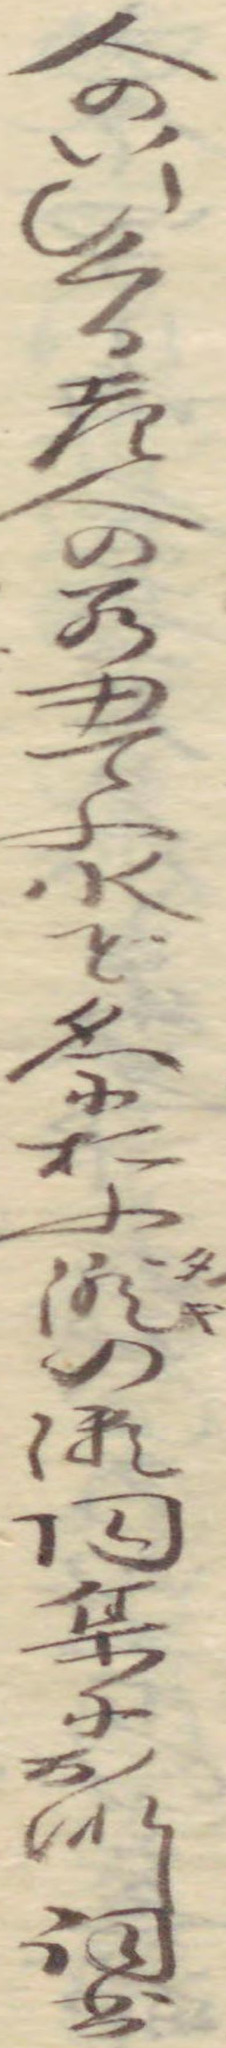人のいひくる老人の若ゆてふ水そ名におふ滝の瀬同集におなし詞書
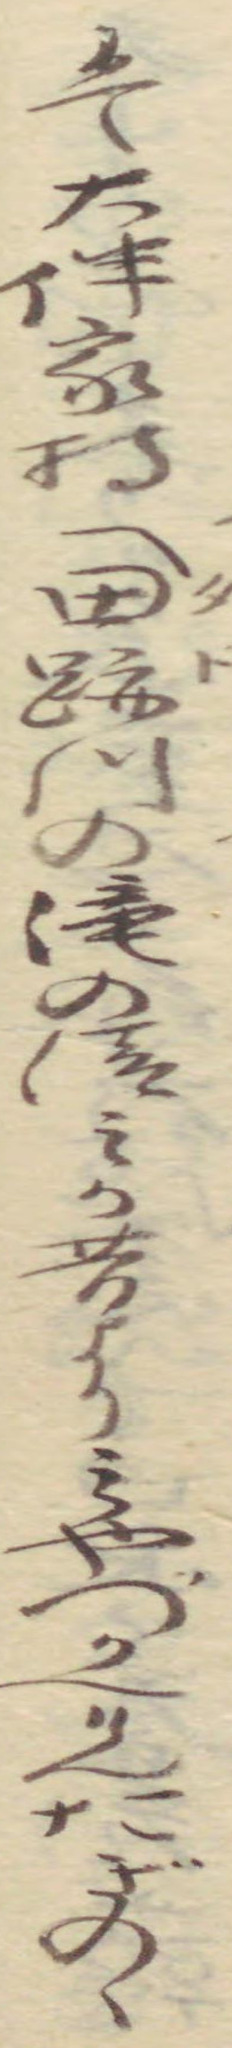にて大伴家持〽田跡川の滝の清みか昔よりみやづかへけんたぎのゝ
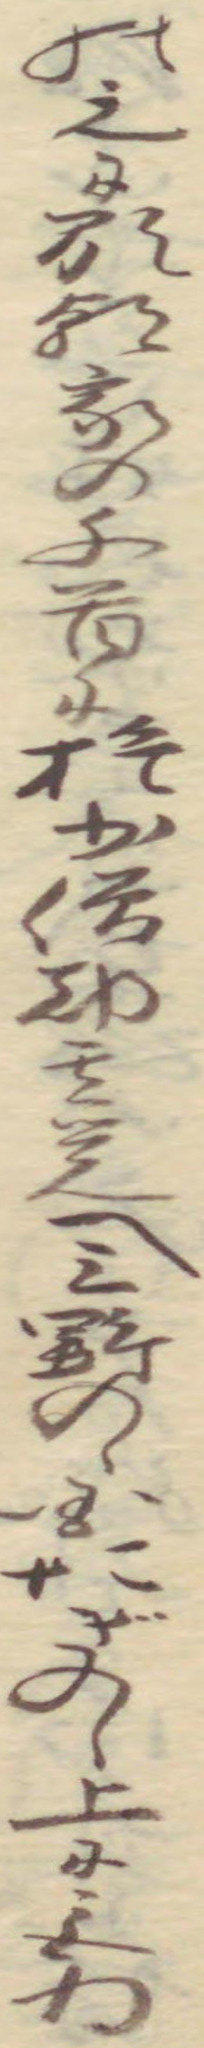のうへに顕朝家の千首に権少僧都其覚〽三野のゝたぎのゝ上に宮ゐ
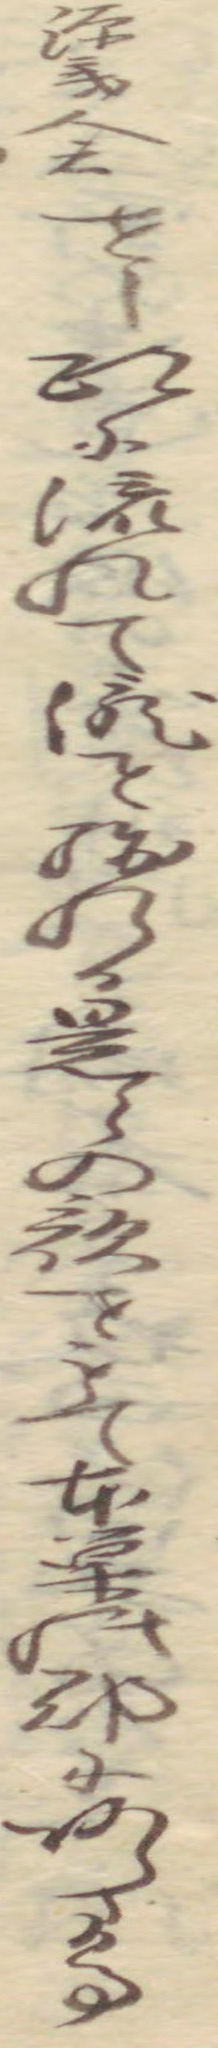せし跡に流れて滝そ残れる是らの歌をもて本巣の郡にあらさる事
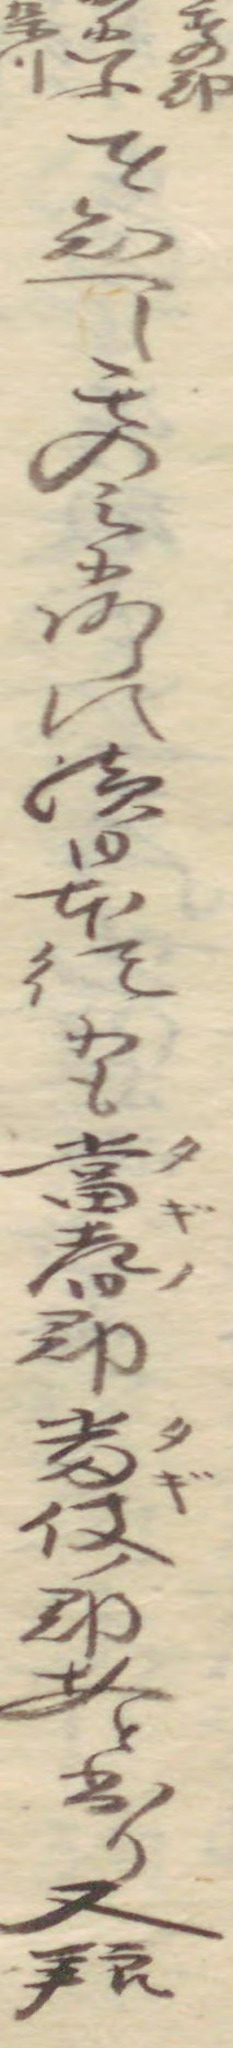を知へし其のみにあらす続日本記にも当耆郡当伎ノ郡なと書り又羪
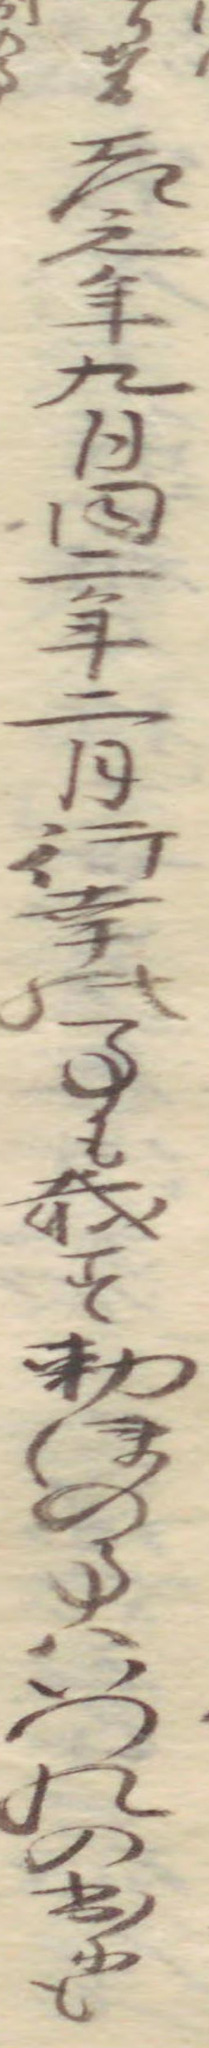老元年九月同二年二月行幸の事も載す勅使の事はいつれの書にも
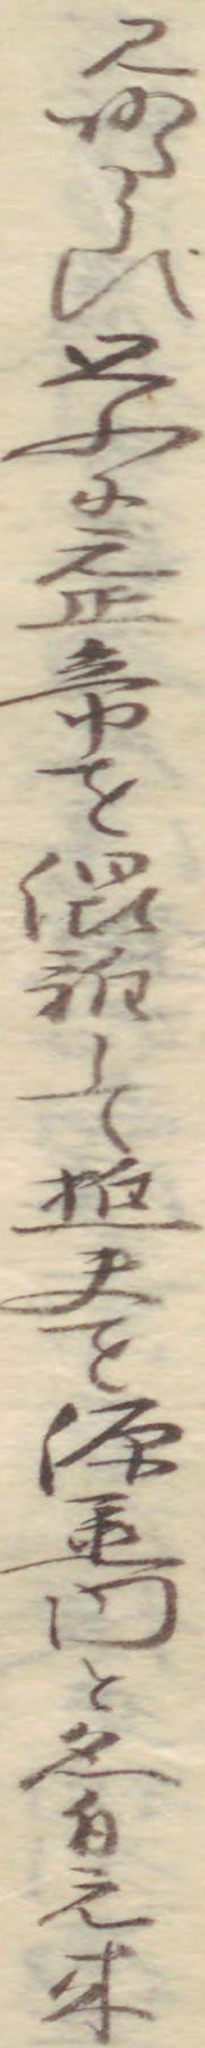見あたらず思ふに元正帝を混雑して樵夫を源丞内と名付元来
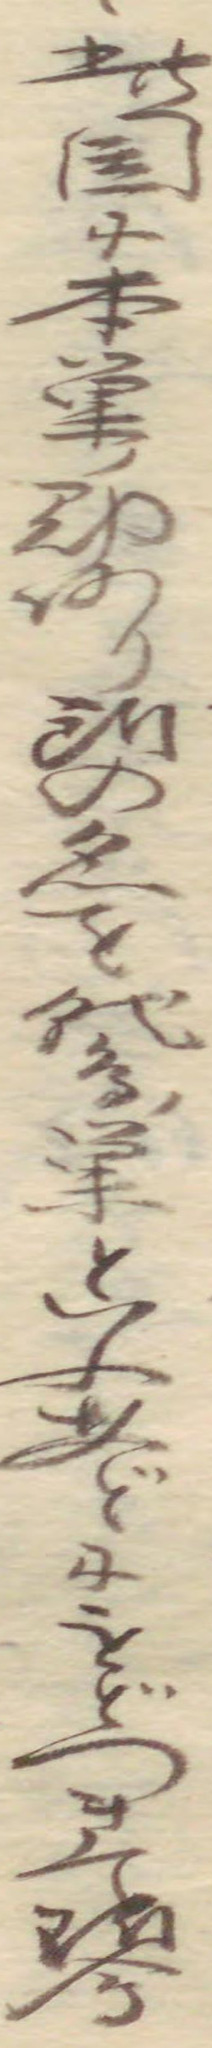此国に本巣ノ郡あり所の名を鷲巣といふなどにもどつきて附会
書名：鶯宿雑記. 巻263-264
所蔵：国立国会図書館 National Diet Library, JAPAN
